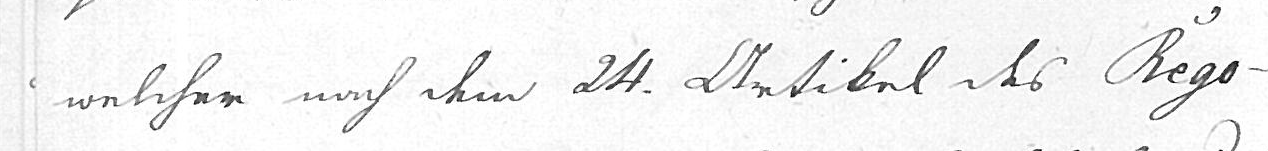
welcher nach dem 24. Artikel des Rego-
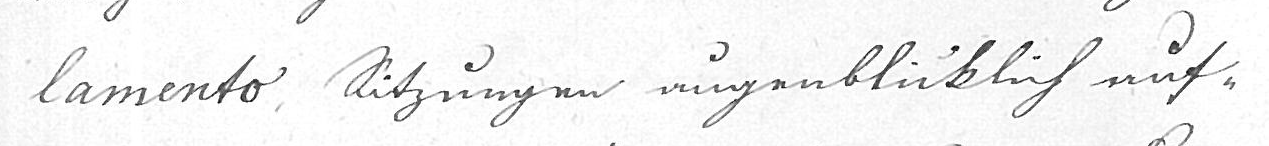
lamento, Sitzungen augenblicklich auf-
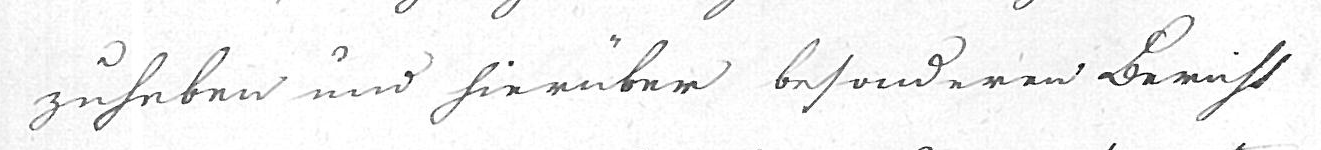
zuheben und hierüber besonderen Bericht
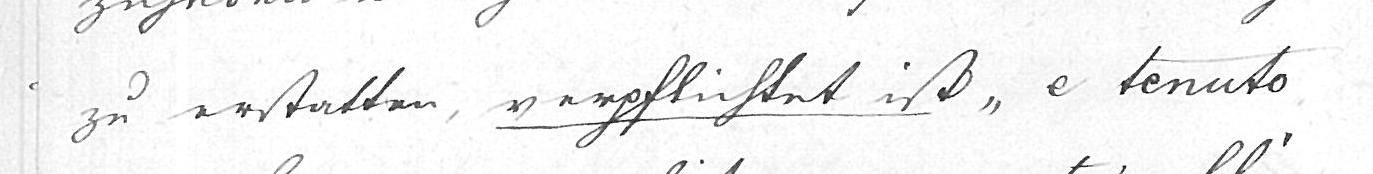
zu erstatten, verpflichtet ist, "e tenuto
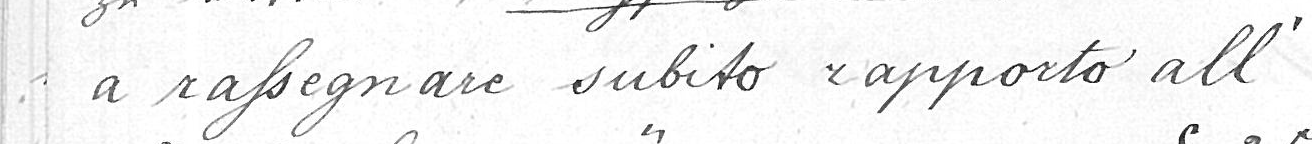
a Rassegnare subito rapporto all'
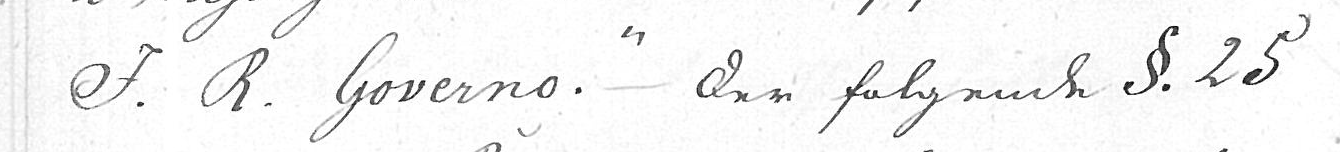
J. R. Governo." Der folgende § 25
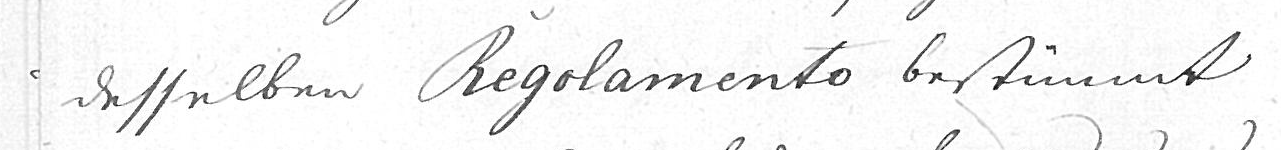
desselben Regolamento bestimmt
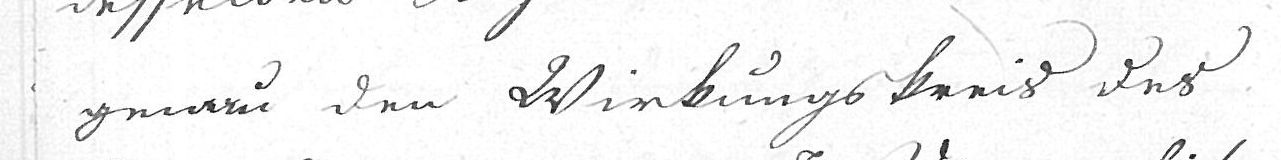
genau den Wirkungskreis des
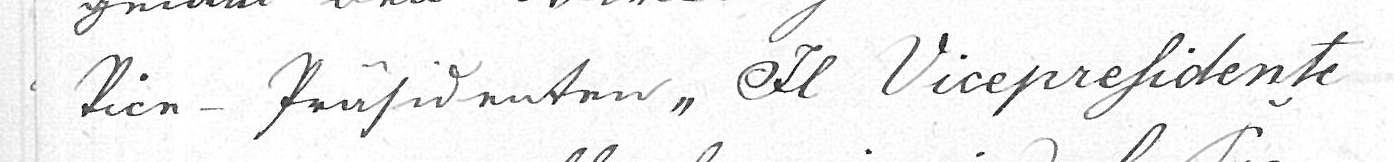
Vice-Präsidenten "Il Vicepresidente
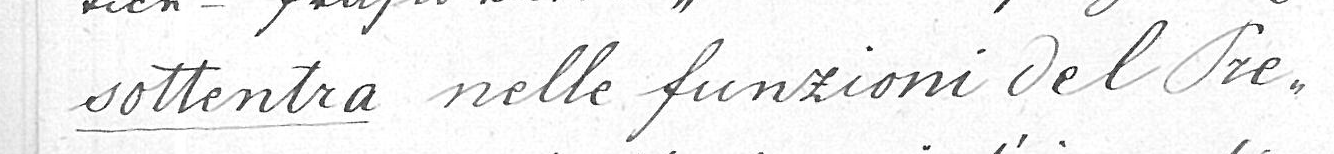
sottentra nelle funzioni del Pre-
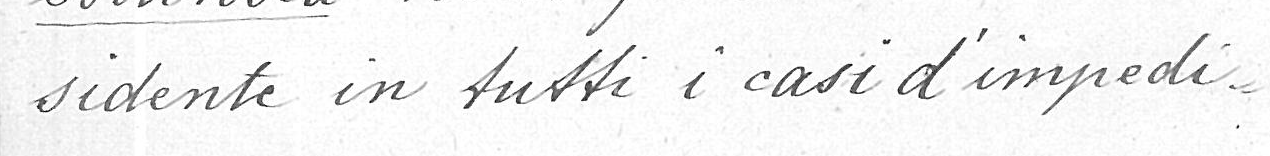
sidente in tutti i casi d'impedi-
